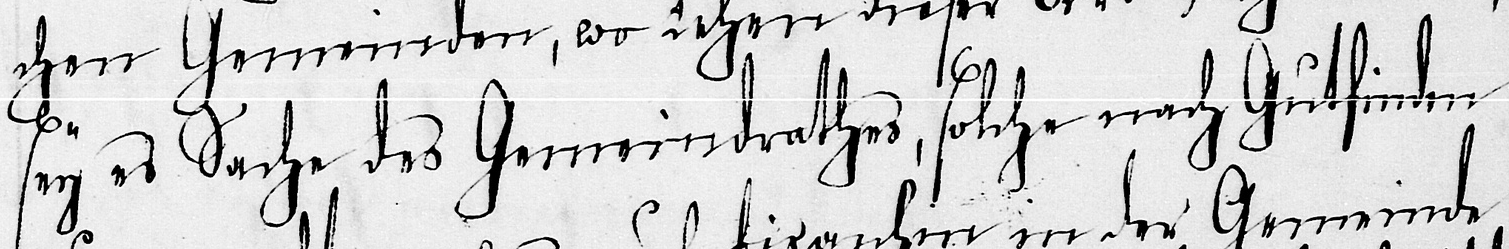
sey es Sache des Gemeindrathes, solche nach Gutfinden
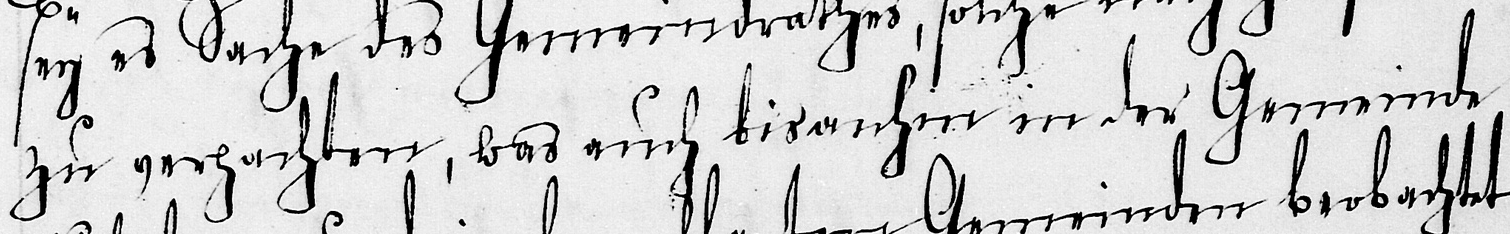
zu verpachten, was auch bis anhin in der Gemeinde
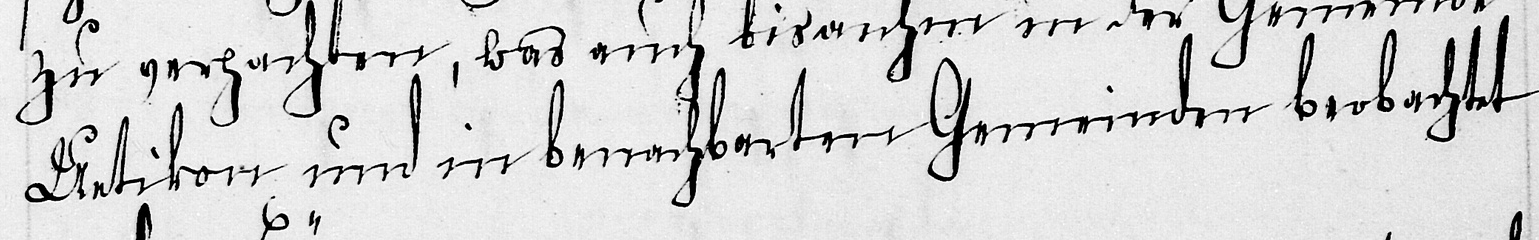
Uetikon und in benachbarten Gemeinden beobachtet
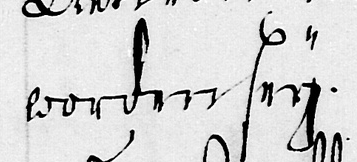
worden sey.
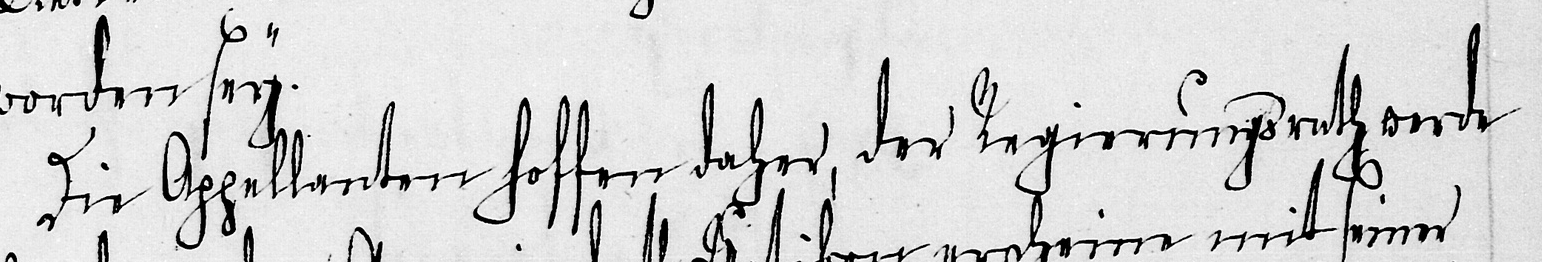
Die Appellanten hoffen daher, der Regierungsrath werde
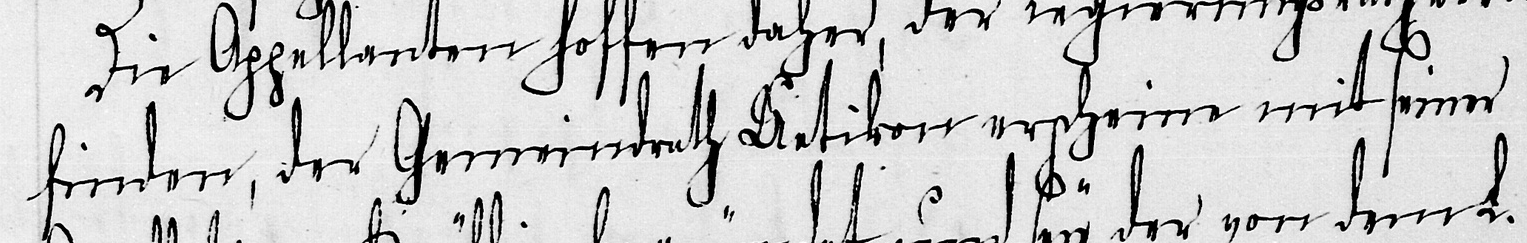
finden, der Gemeindrath Uetikon erscheine mit seiner
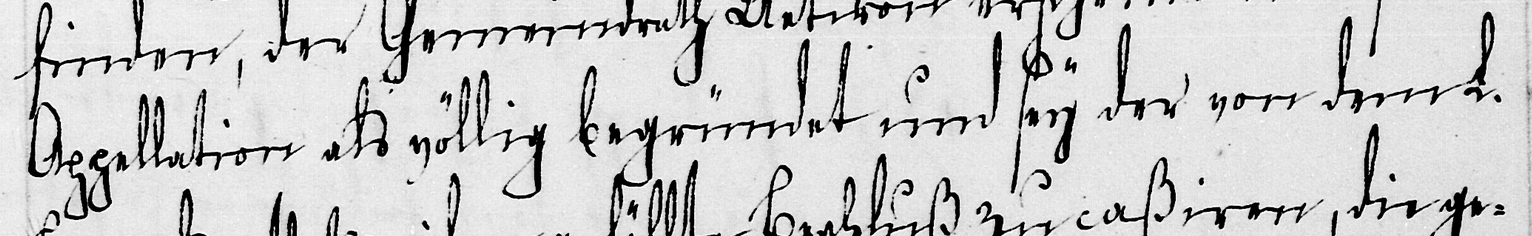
ppellation als völlig begründet und sey der von dem L.
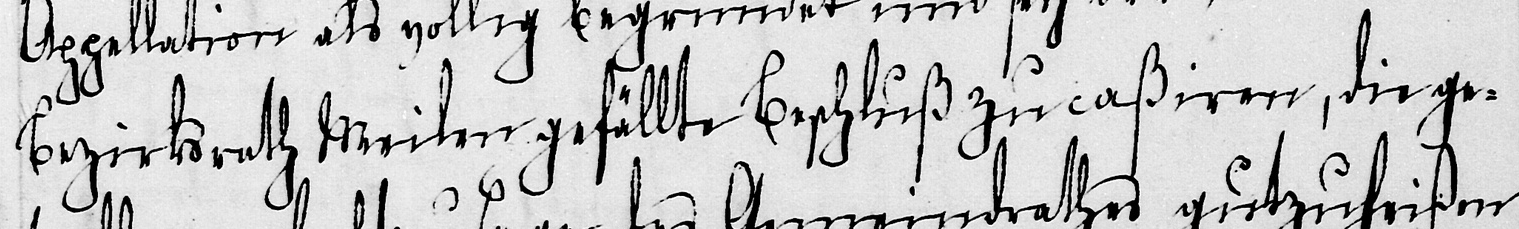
Bezirksrath Meilen gefällte Beschluß zu caßiren, die ge¬
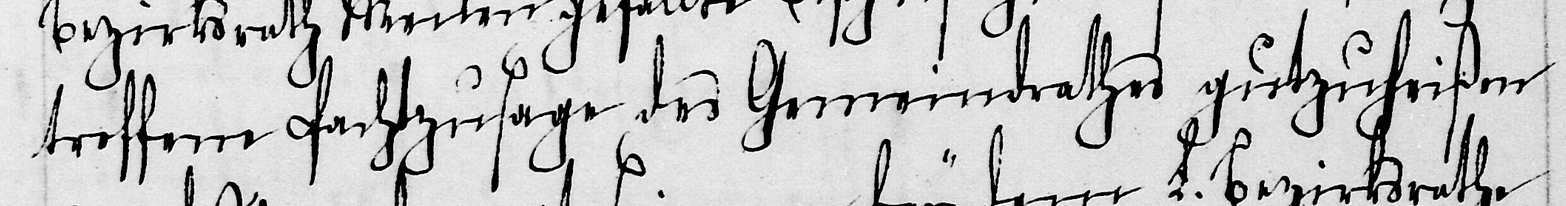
troffene Pachtzusage des Gemeindrathes gutzuheißen
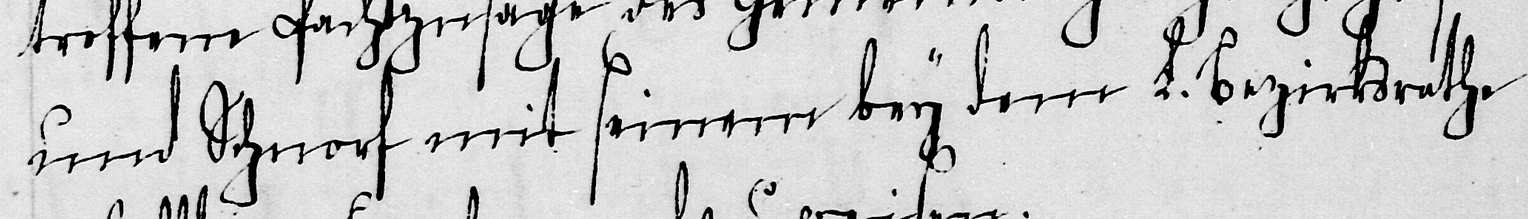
und Schnorf mit seinem bey dem L. Bezirksrathe
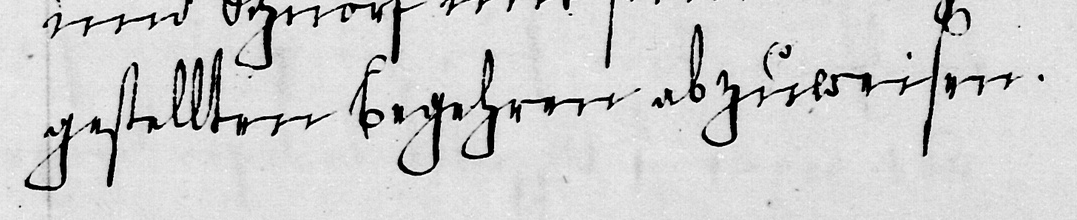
gestellten Begehren abzuweisen.
